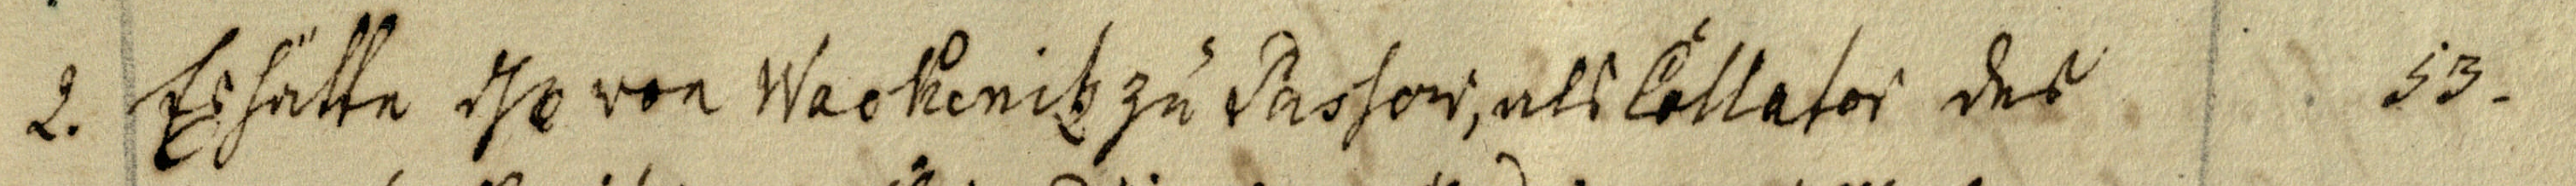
2. Es hätte dh von Wackenitz zu Passow, als Collator des
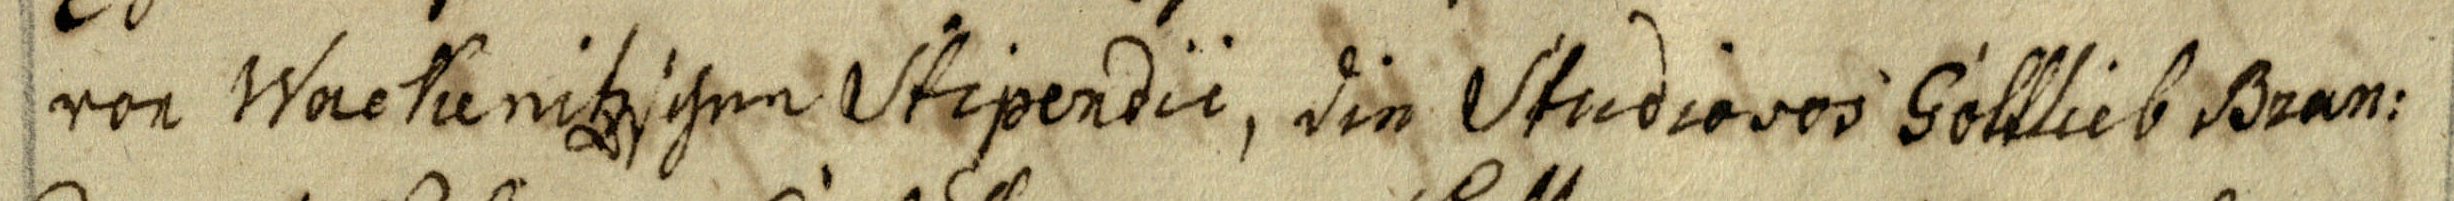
von Wackenitzschen Stipendii, die Studiosos Gottlieb Bran¬
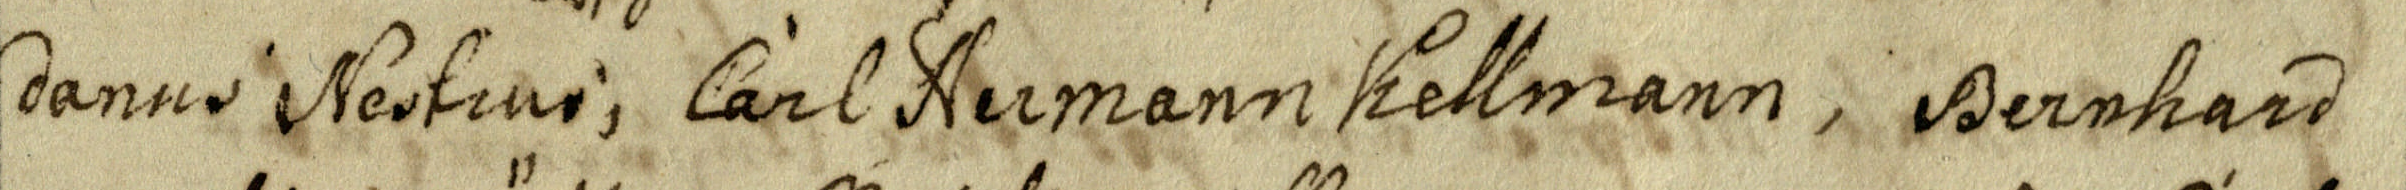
danus Nestius, Carl Hermann Kellmann, Bernhard
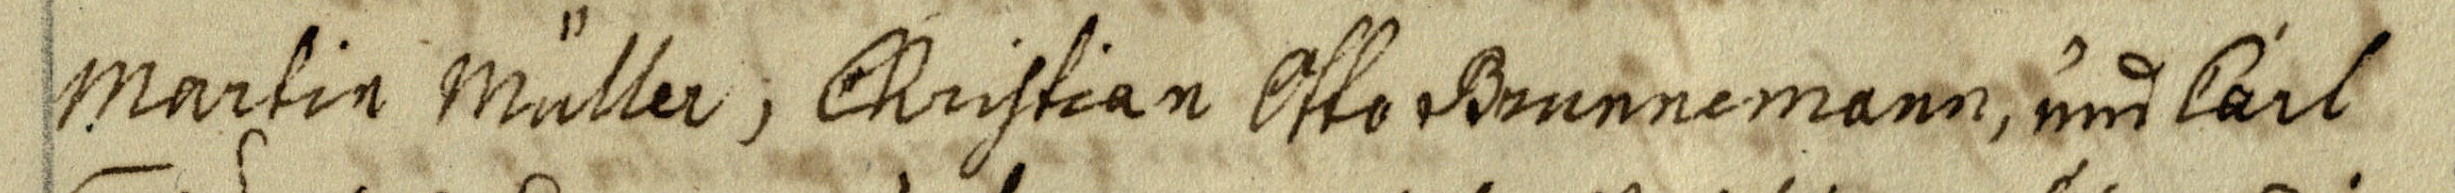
Martin Müller, Christian Otto Brunnemann, und Carl
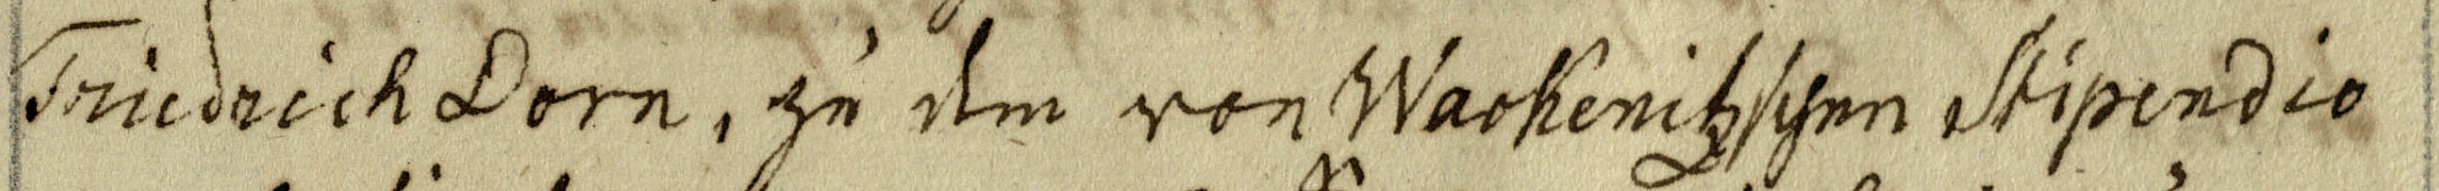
Friedrich Dorn, zu dem von Wackenitzschen Stipendio
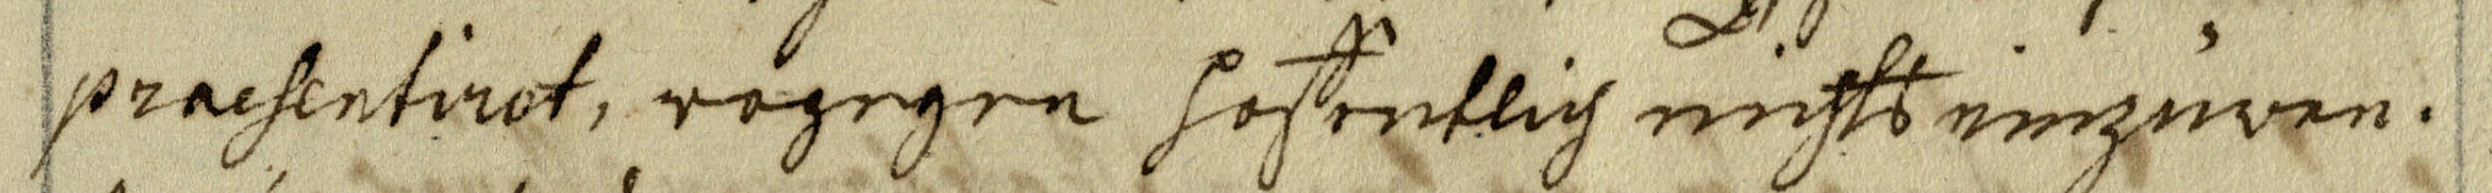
praesentiret, wogegen hoffentlich nichts einzuwen¬
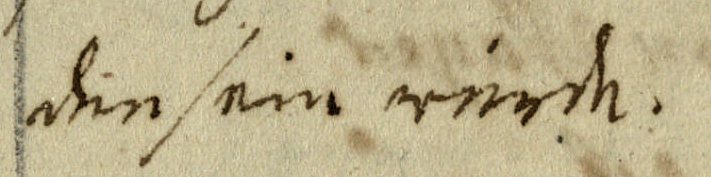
den sein würde.
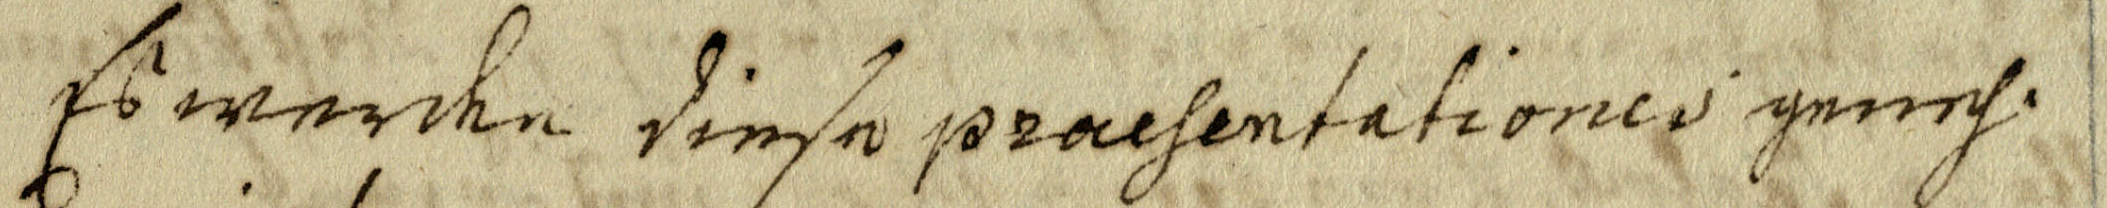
Es werden diese praesentationes geneh¬
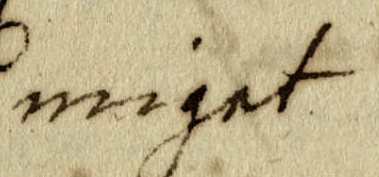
miget.
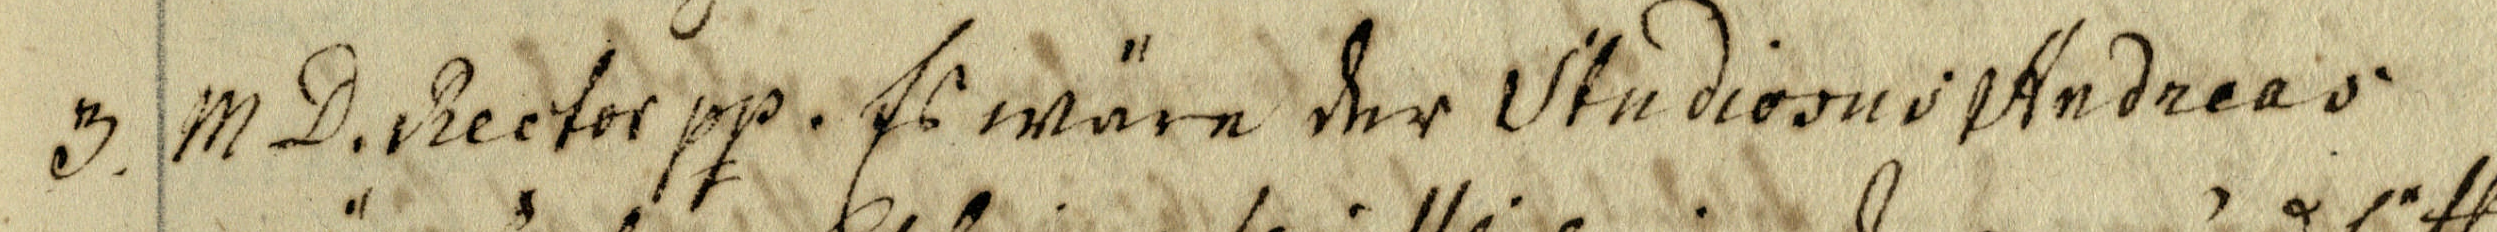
3. M. D. Rector pp. Es wäre der Studiosus Andreas
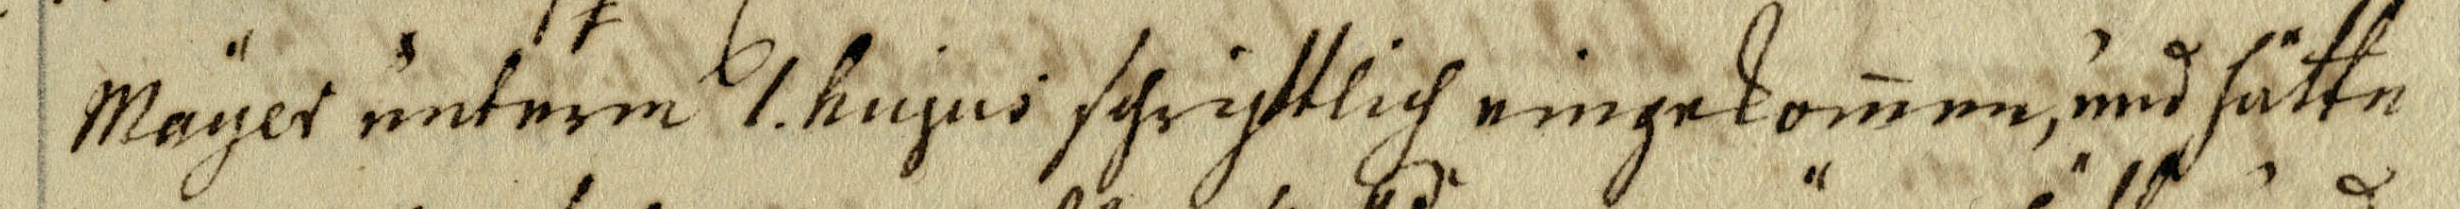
Maÿer unterm 1. hujus schriftlich eingekomen, und hätte
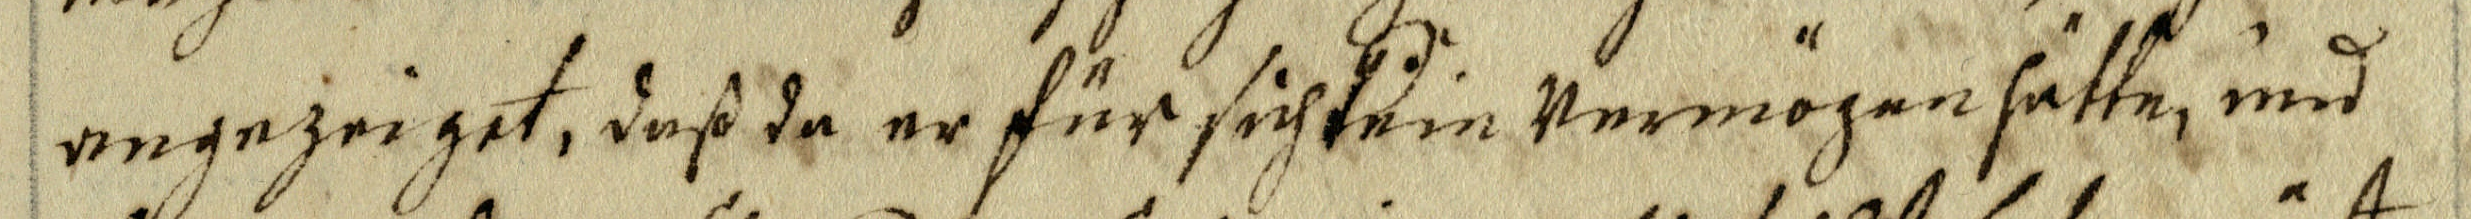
angezeiget, daß da er für sich kein Vermögen hätte, und
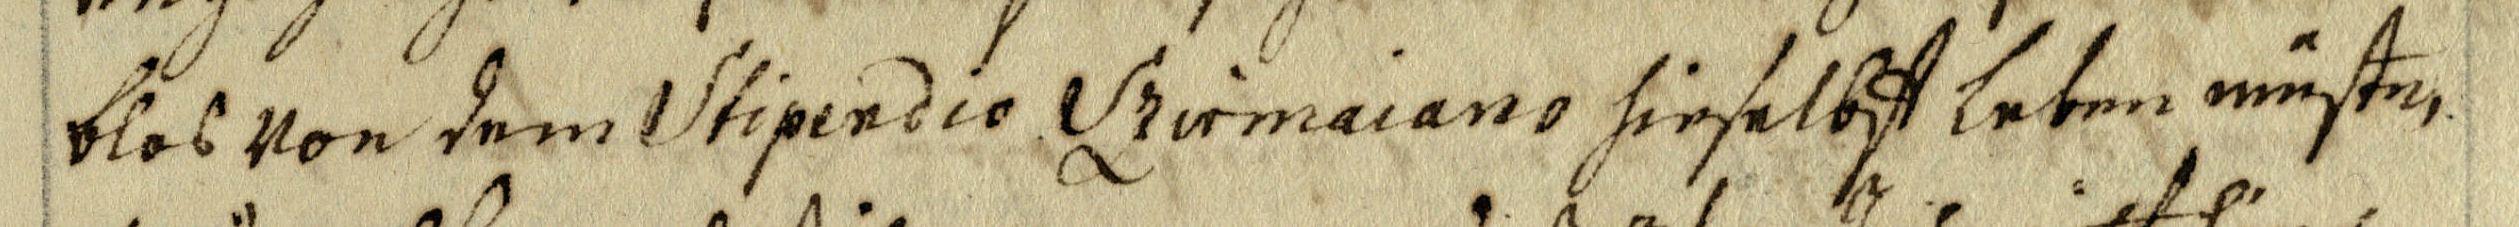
blos von dem Stipendio Szirmaiano hieselbst leben müste,
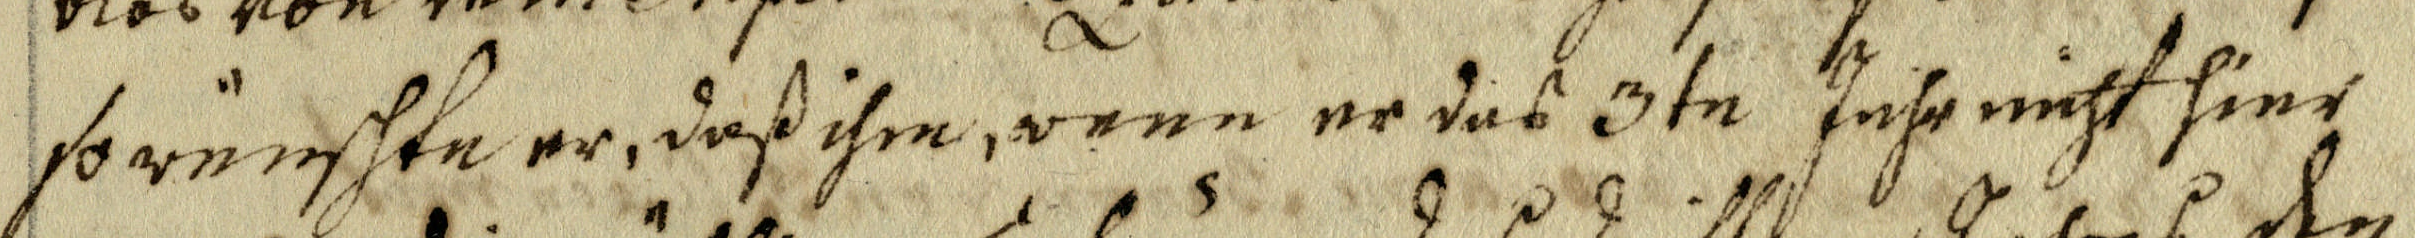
so wünschte er, daß ihm, wenn er das 3 te Jahr nicht hier
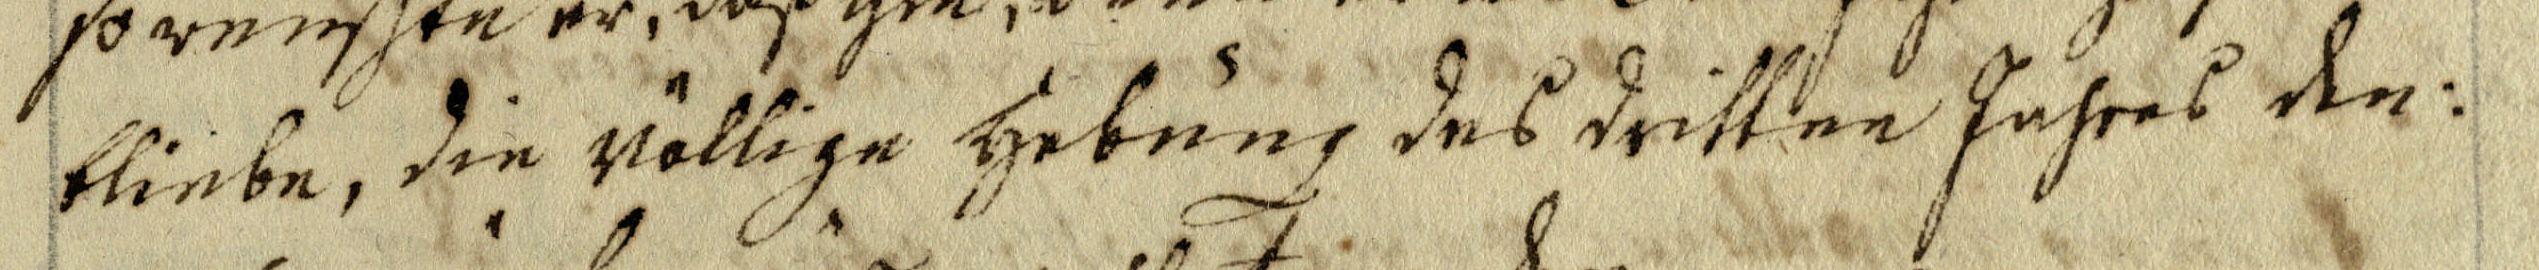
bliebe, die völlige Hebung des dritten Jahres den¬
